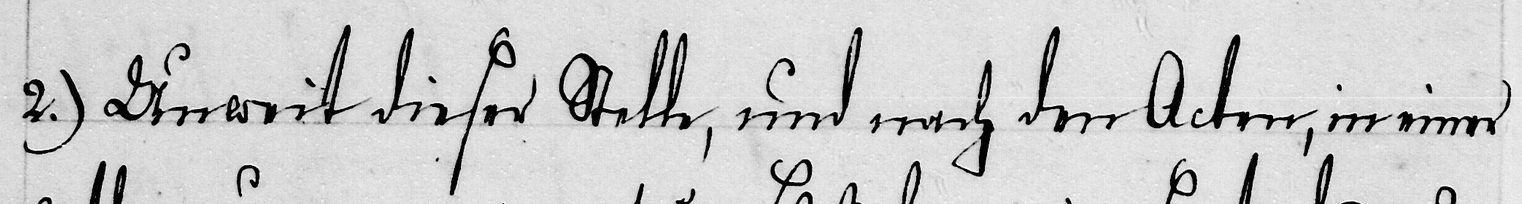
2.) Unweit dieser Stelle, und nach den Acten, in einer
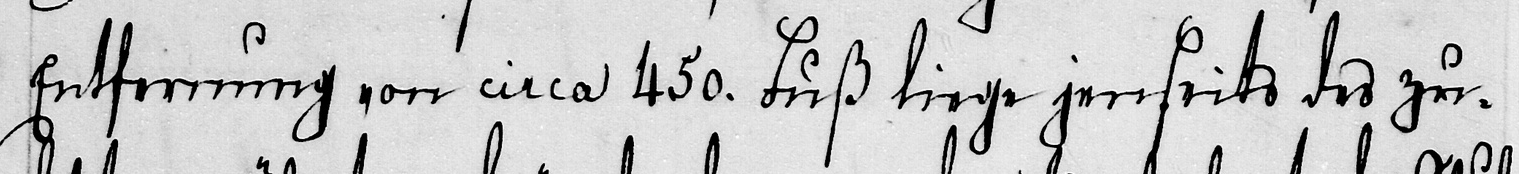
Entfernung von circa 450. Fuß liege jenseits des zu¬
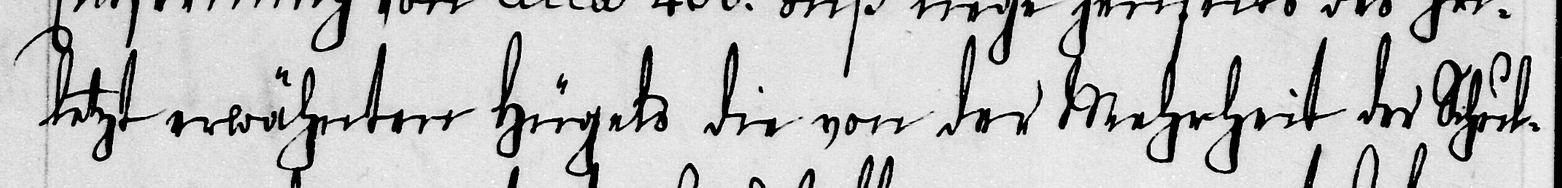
letzt erwähnten Hügels die von der Mehrheit der Schul¬
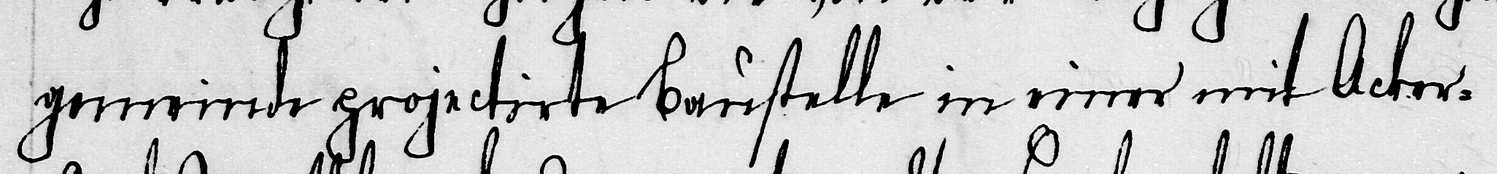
gemeinde projectirte Baustelle in einer mit Acker-
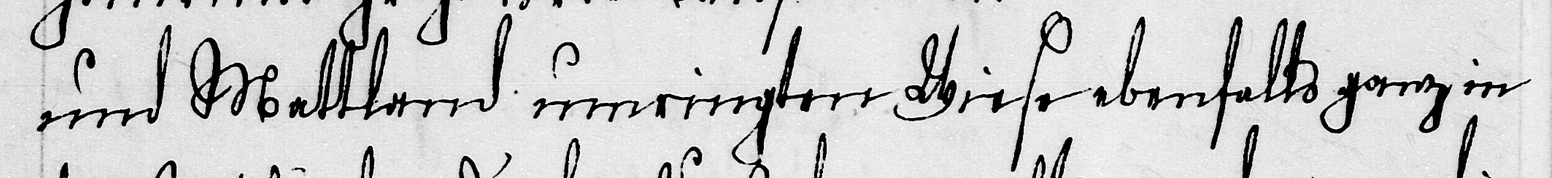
und Mattland umringten Wiese ebenfalls ganz in
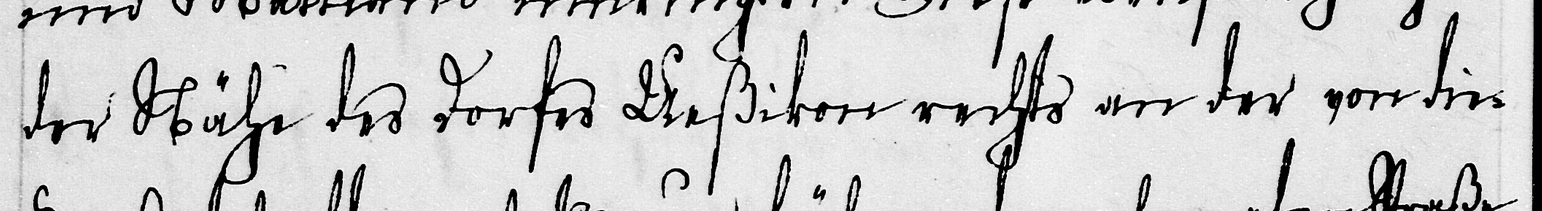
der Nähe des Dorfes Ueßikon rechts an der von die¬
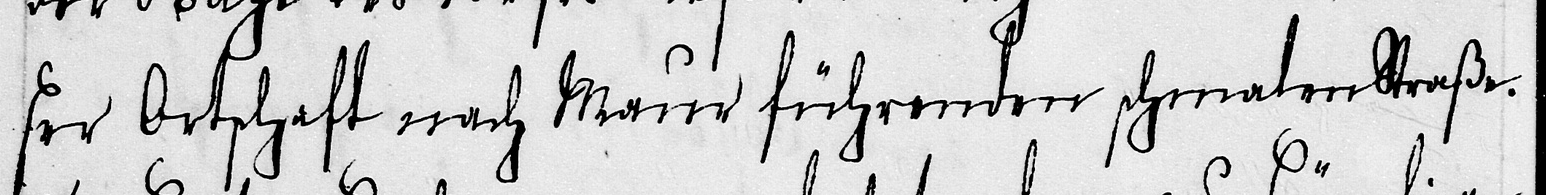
ser Ortschaft nach Maur führenden schmalen Straße.
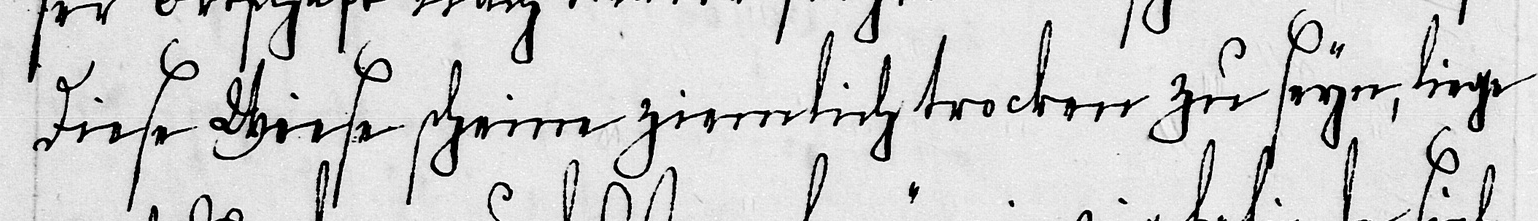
Diese Wiese scheine ziemlich trocken zu seyn, liege
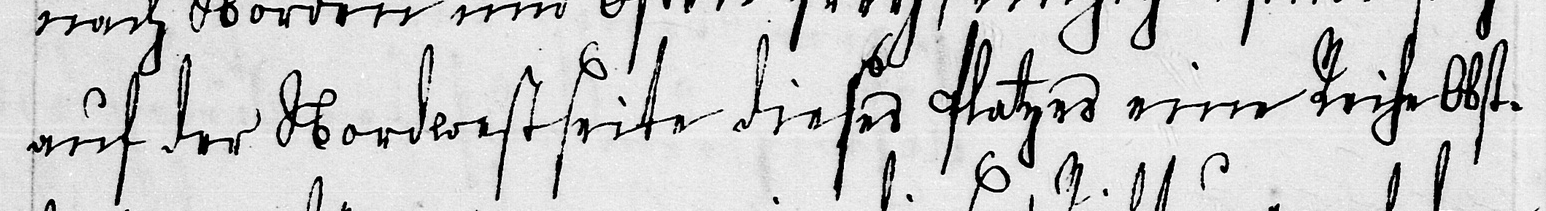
auf der Nordwestseite dieses Platzes eine Reihe Obs¬
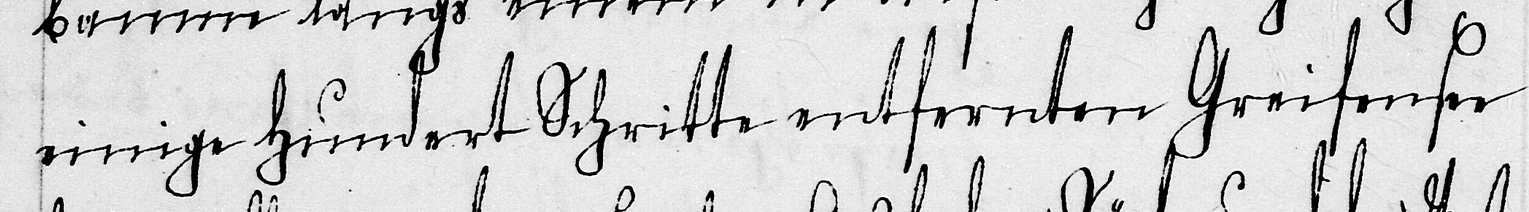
einige Hundert Schritte entfernten Greifensee
